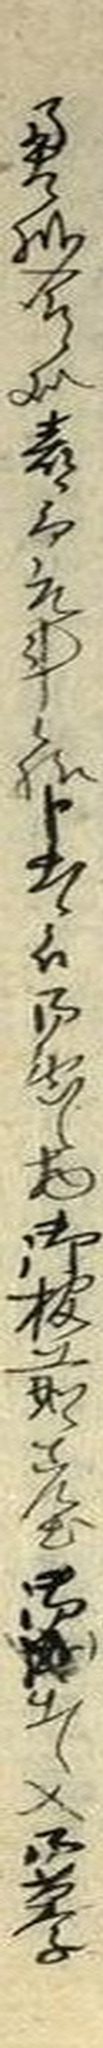奥に掛合候処表ニ而取斗候様申出候ニ付御臺之物御棺前へ差出御引出し入候御菓子
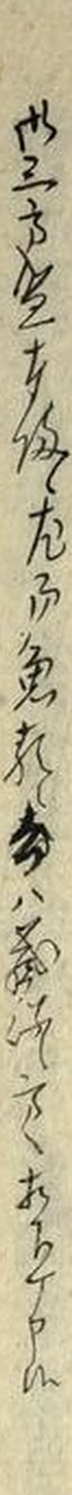御三方盛奉備候尤御魚類之分ハ蔵役之方へ相下ヶ申候
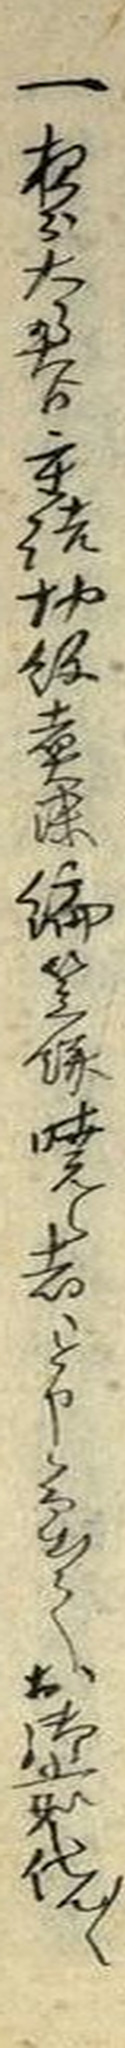一夜分大奥ゟ重詰切飯煮染編笠餅暁之者へと申候而出之於御前代ル〳〵
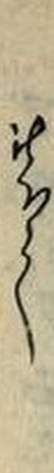被下之
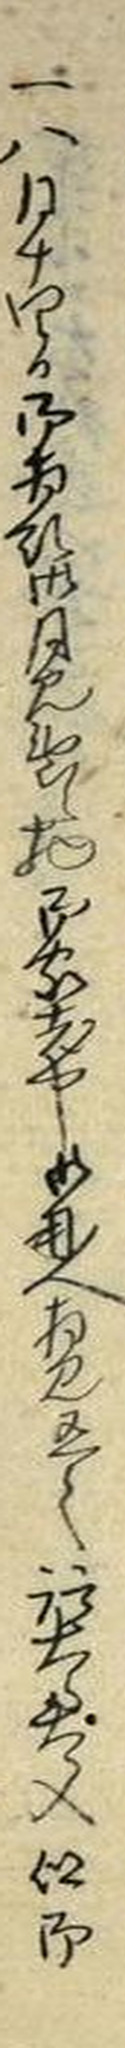一八月十四日御拝領御月見台之物御家老中御用人拝見有之跡大奥被入但御

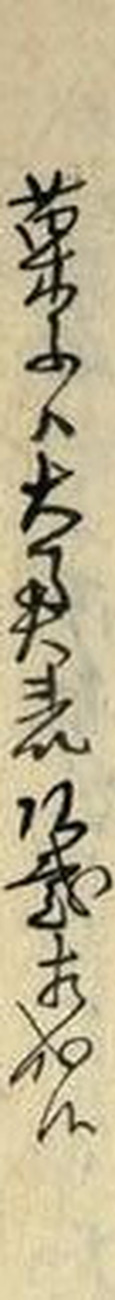菓子ハ大奥表頂戴相成候
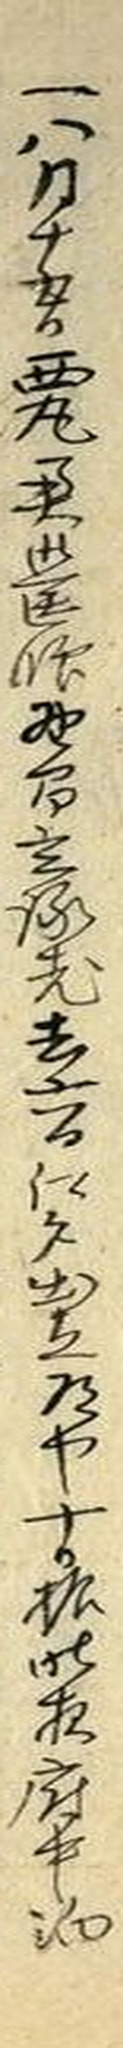一八月十五日西丸奥御医師野間玄琢老去六日江戸出立道中十日振昨夜府中泊
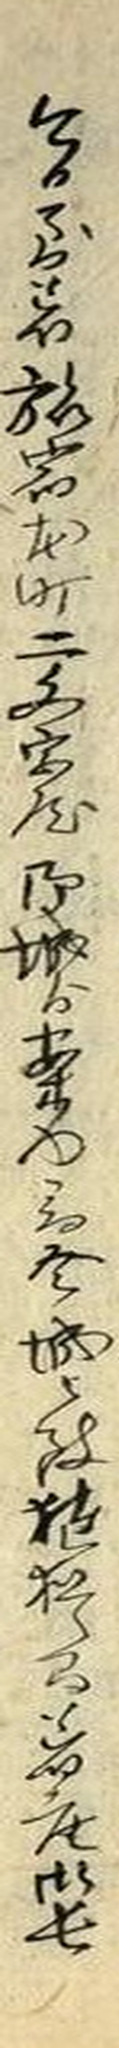今日到着旅宿本町二文字屋御城ゟ案内ニ而登城被致韃靼之間着座御長
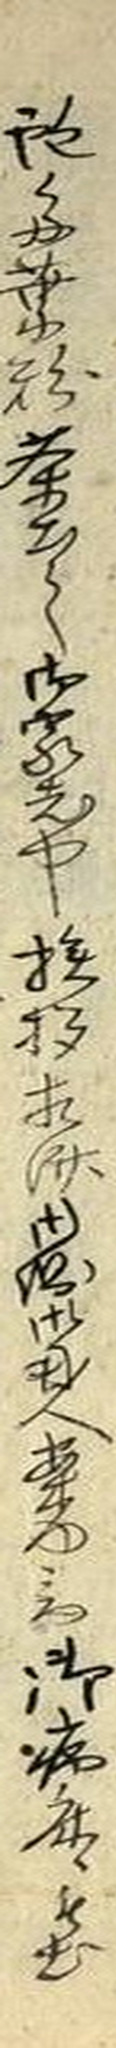鮑多葉粉茶出之御家老中挨拶相済御側御用人案内ニ而御病床へ被出
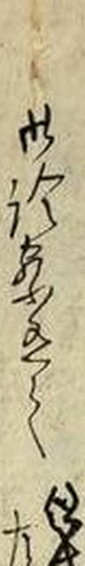御診察有之
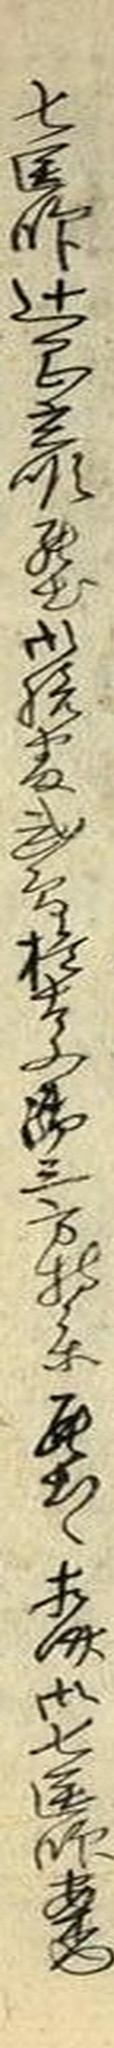匕医師辻岡玄順罷出御膳番武曾権太夫御三方持参罷出候相済御匕医師案内
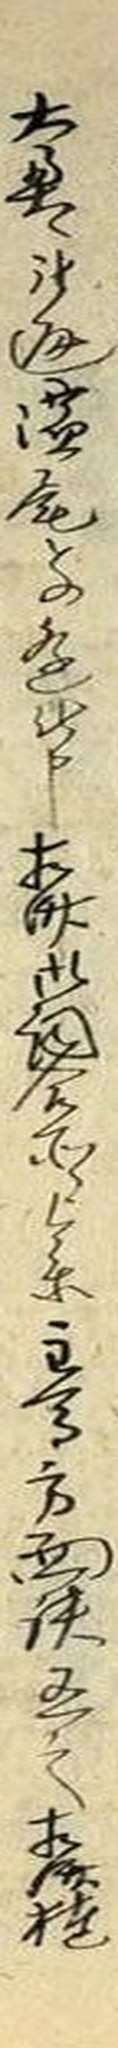大奥へ被通濱尾との逢被申相済御調合所へ被参主馬方面談有之相済韃
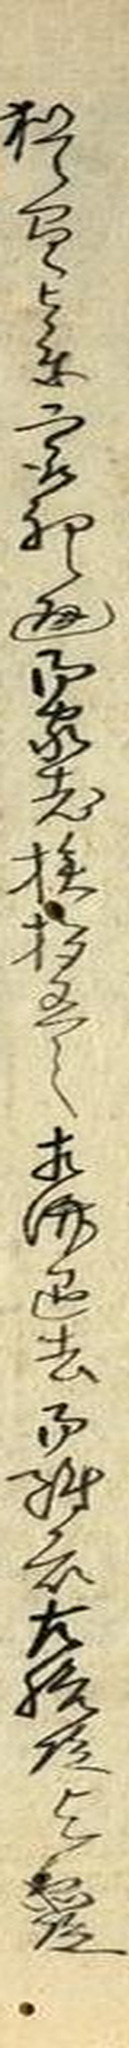靼之間へ被参最初之通御家老挨拶有之相済退去御附衆左膳殿与兵衛殿
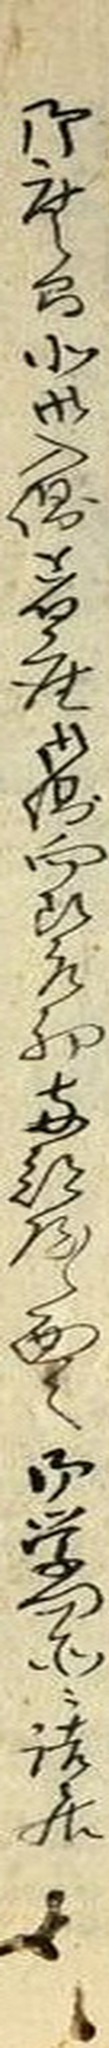御座之間北御入側着座御側向頭取初両部屋之面々御学問所ニ詰居
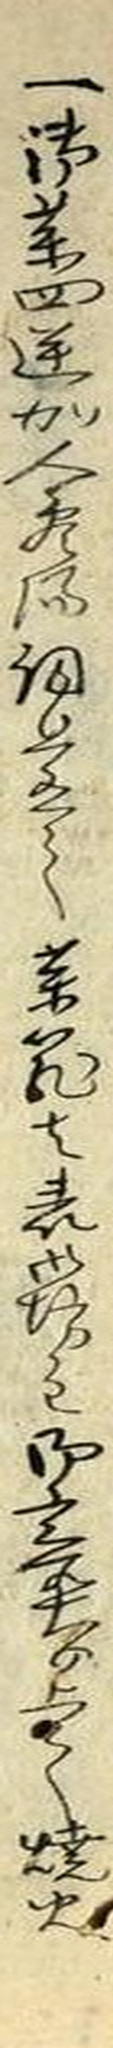一御薬四逆加人参湯調上有之薬籠者表御坊主御玄関ゟ上之焼火
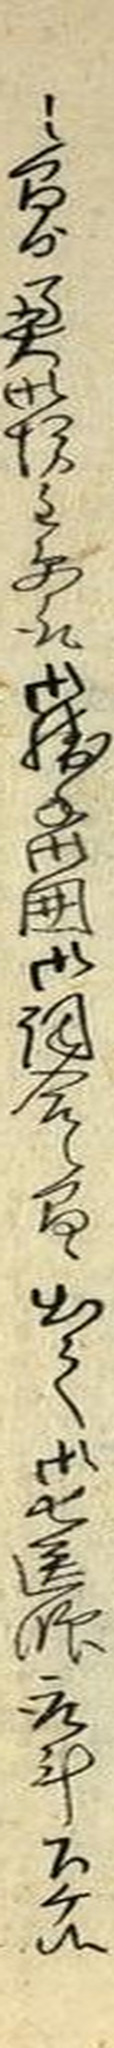之間ゟ奥御坊主受取御勝手御囲御調合之間へ出之御匕医師取斗下ヶ候
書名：少傅日録抄（斉善付側向頭取日記、江戸并道中、初入在国、逝去後…
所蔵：福井県文書館 Fukui Prefectural Archives
